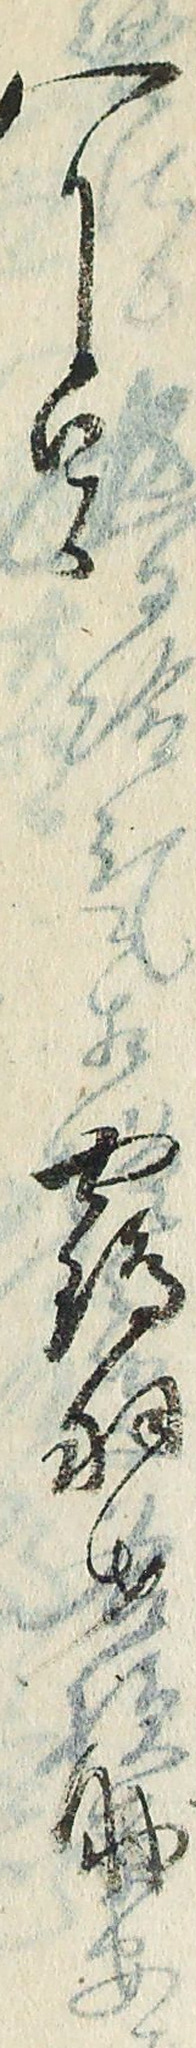八月四日鶴羽才助
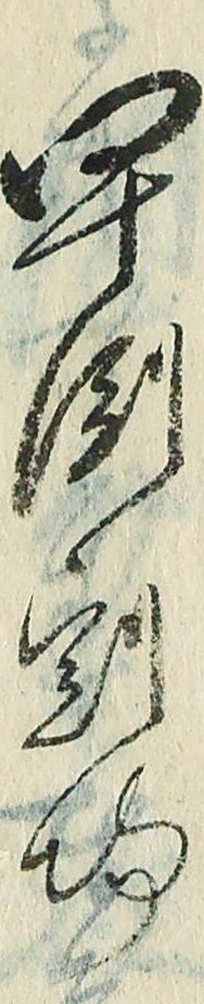早淵割場
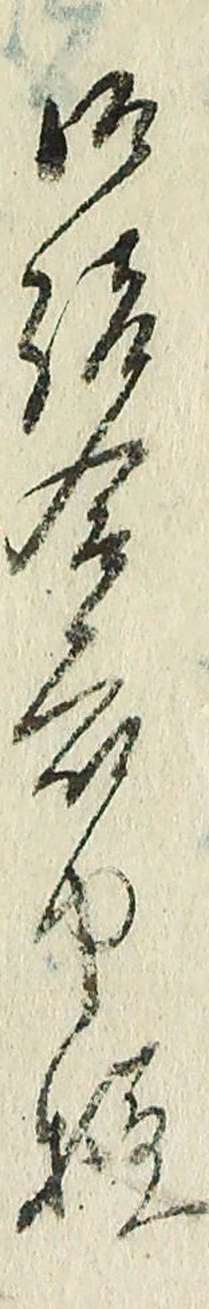御請合衆中様
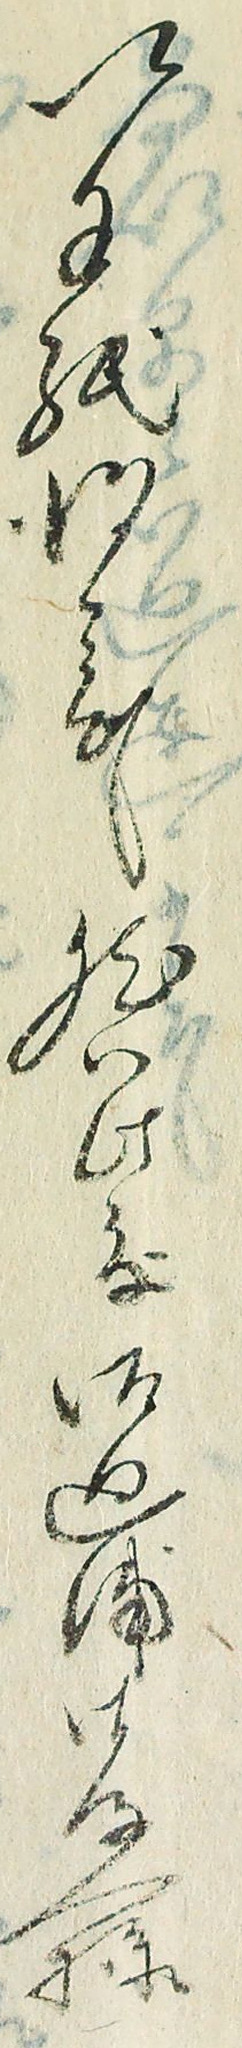以手紙得御意候然は此度御廻浦御役人様
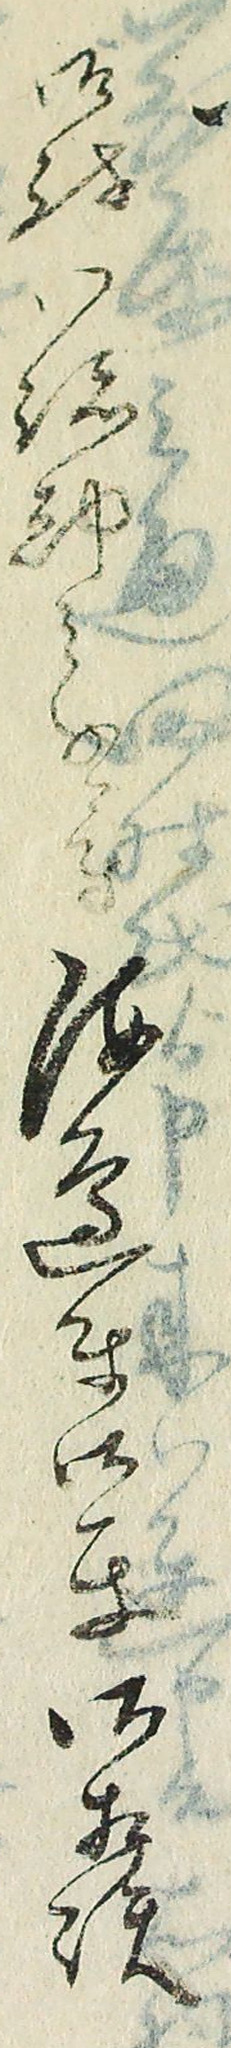御越御諸勤之義に付海辺付御互御相談
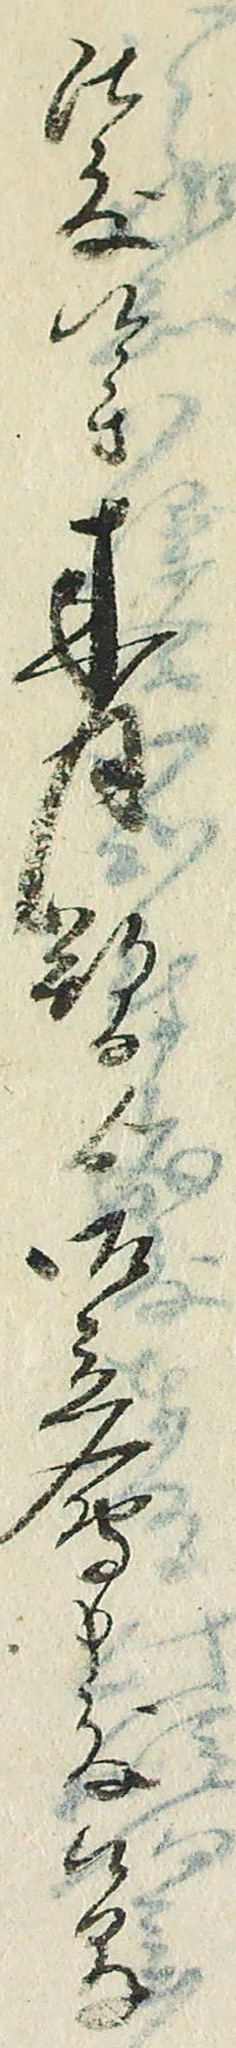仕度候に付来月朔日ゟ御立会申度候間
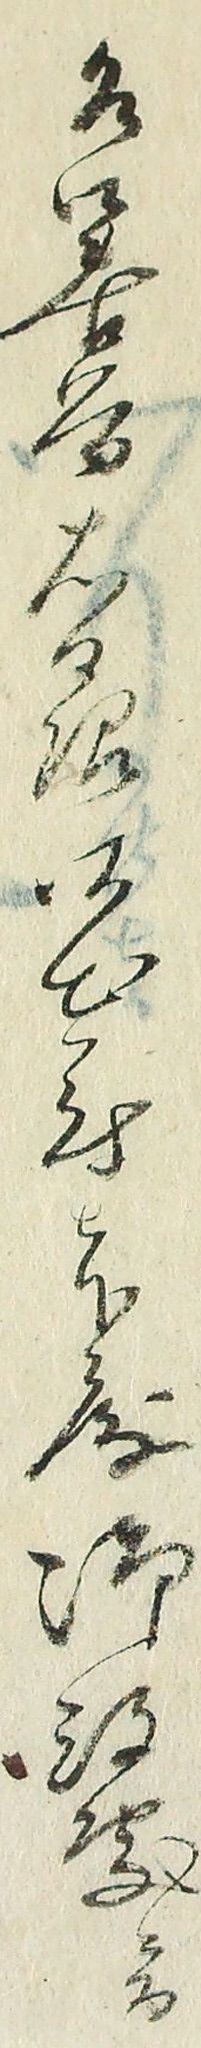乍御苦労右日限御出座被下度御役処にて
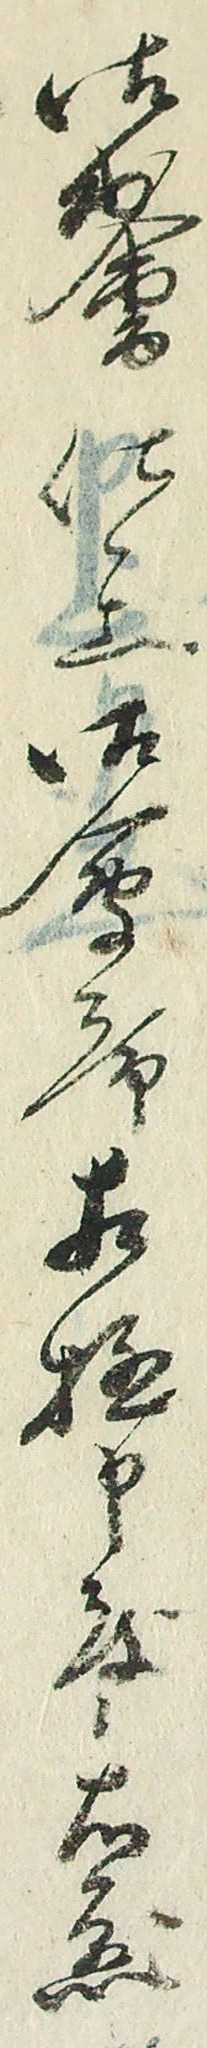御出会仕候上御会序相極申度候右懸
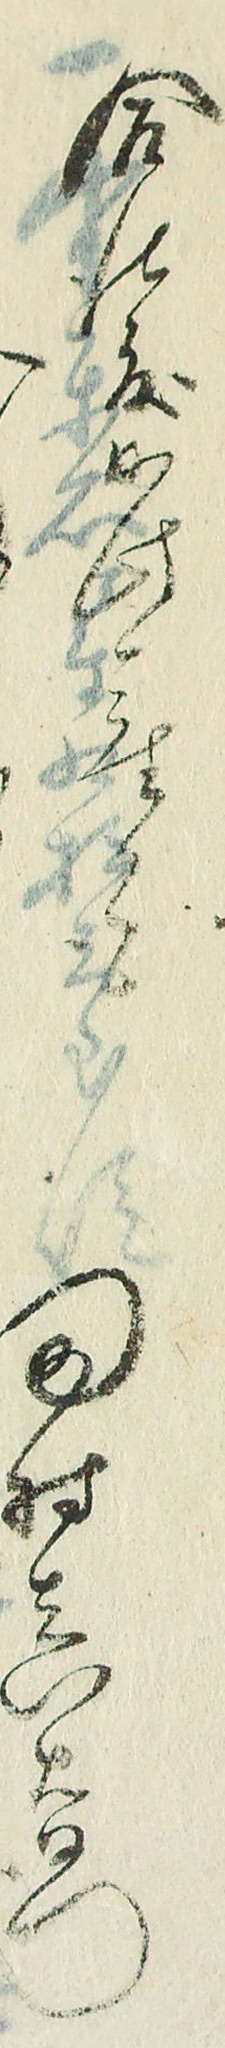合仕度如此御座候以上田村真右衛門
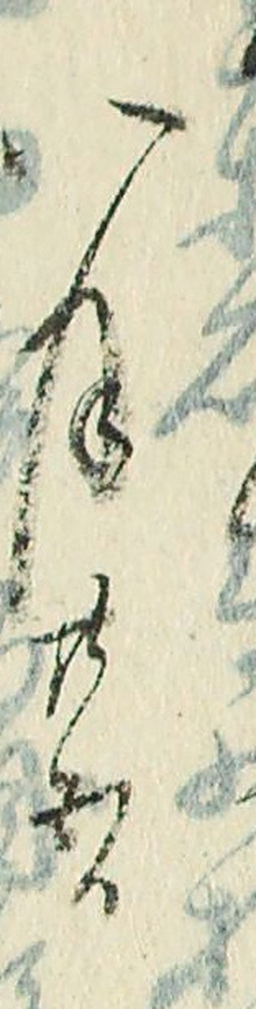八月廿五日
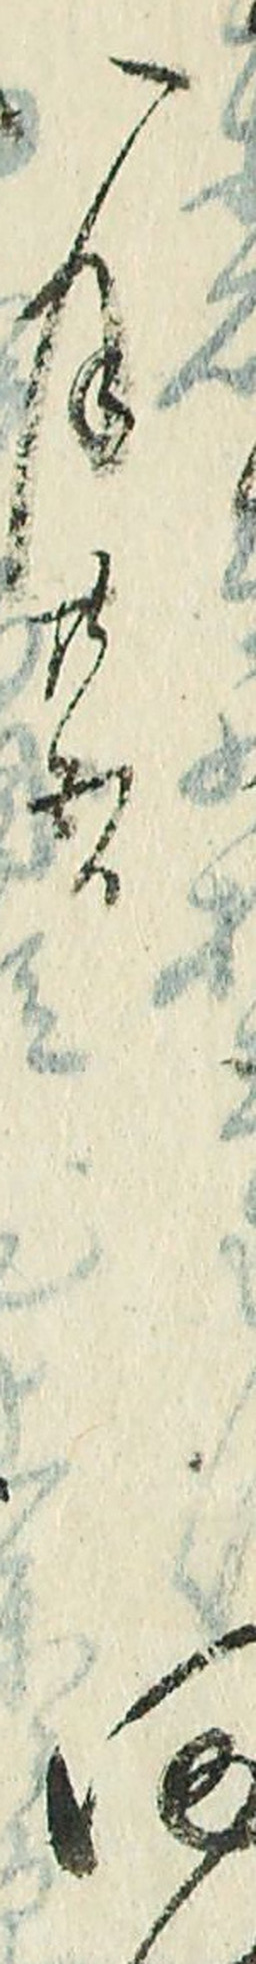八月廿五日
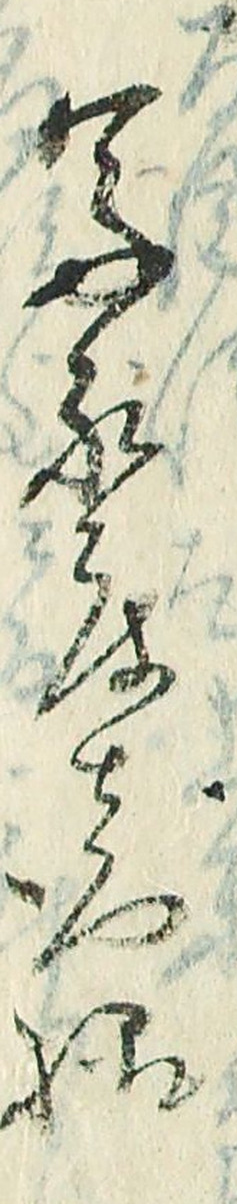富永茂右衛門様

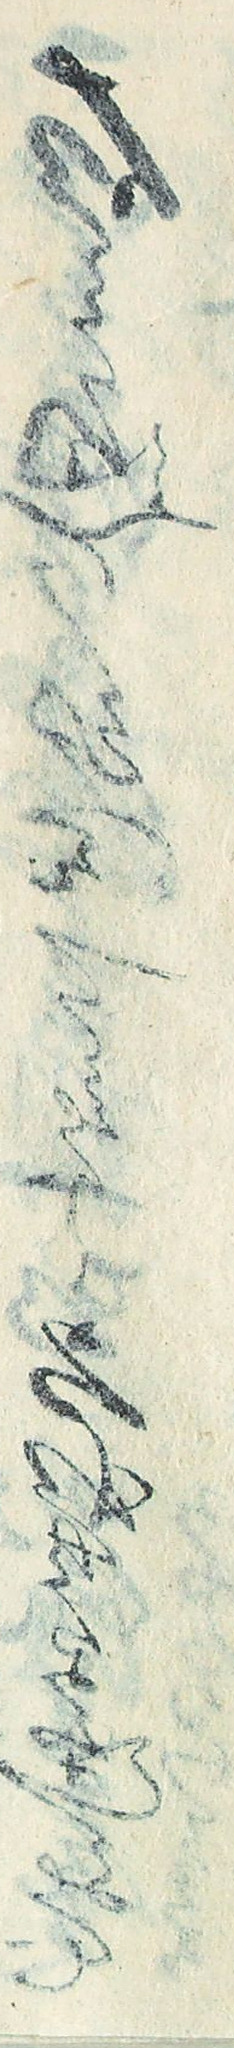八月廿七日
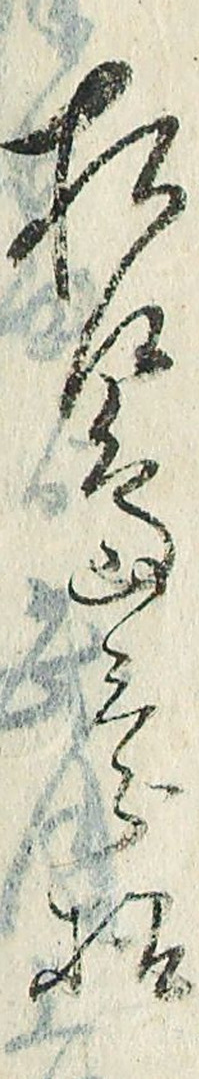松江島三郎様
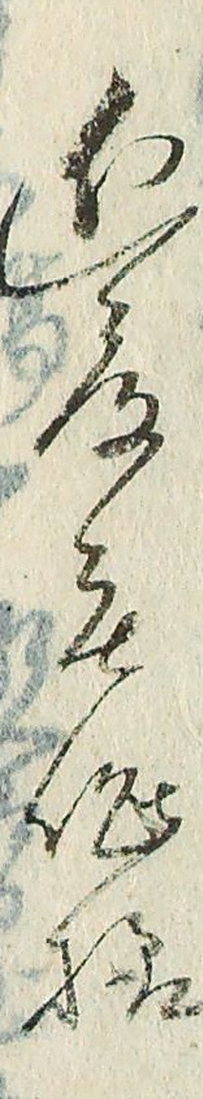近藤庄作様
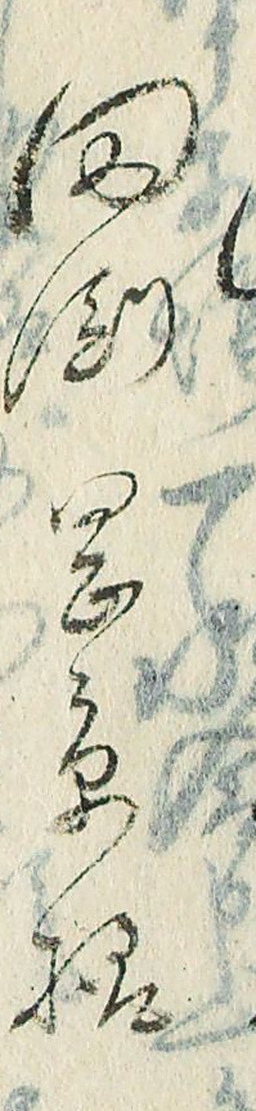田淵岡兵衛様
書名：公辺御役人為御廻浦御立越諸御用一巻
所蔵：鳴門教育大学 Naruto University of Education
